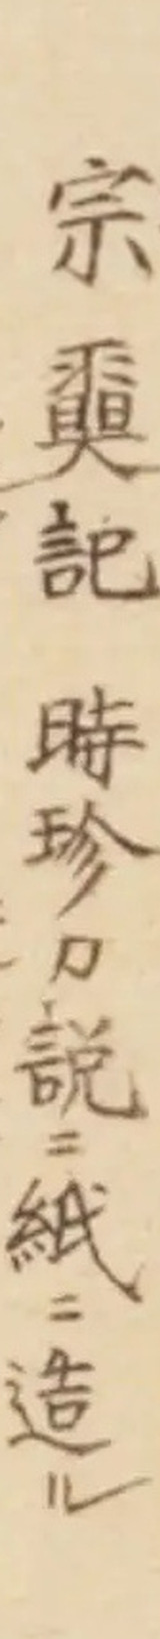宗記時珍カ説ニ紙ニ造ル
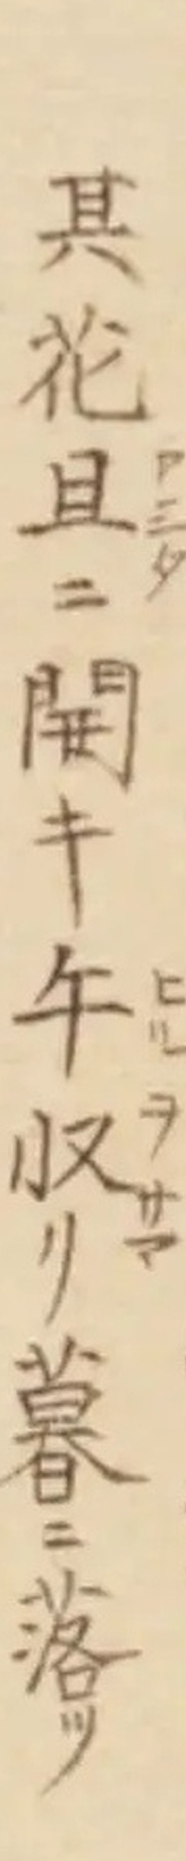其花旦ニ開キ午収リ暮ニ落ツ
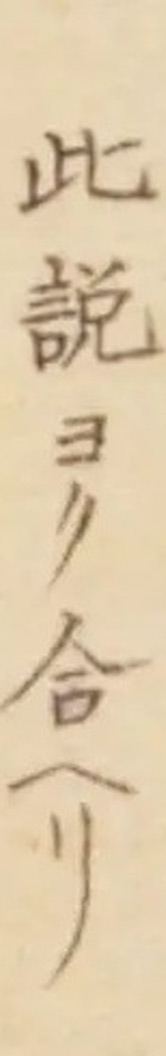此説ヨリ合ヘリ
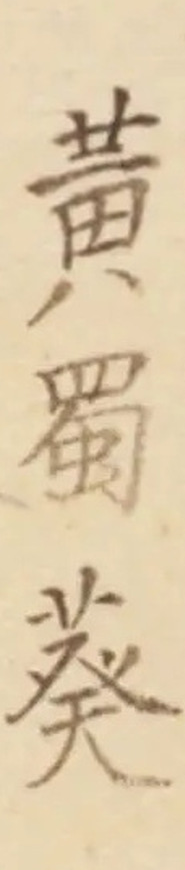黄蜀葵
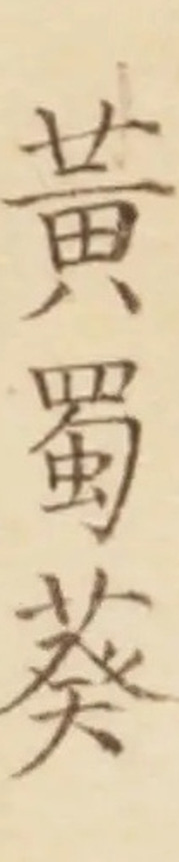黄蜀葵
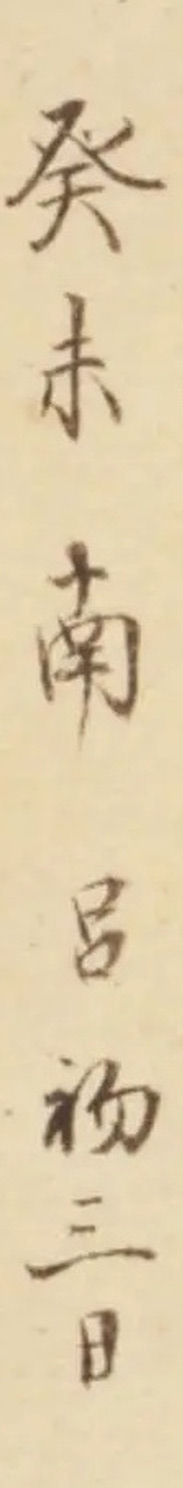癸未南呂三日
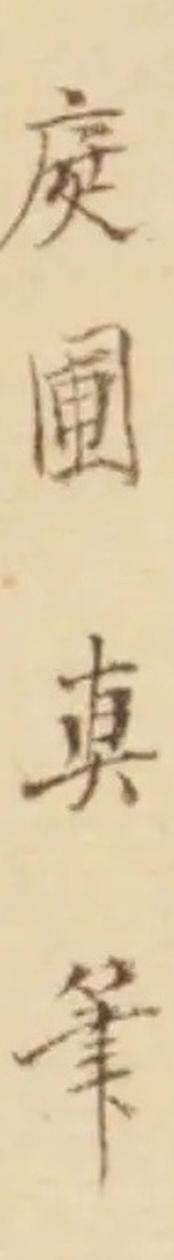庭圃真筆

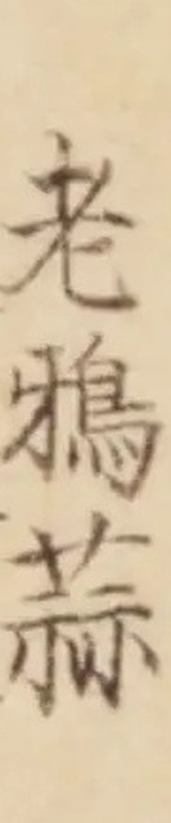老鴉蒜
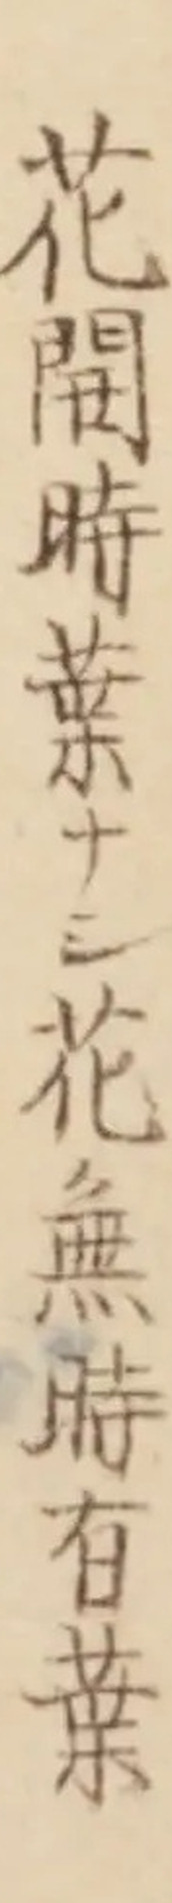花開時葉ナシ花無時有葉
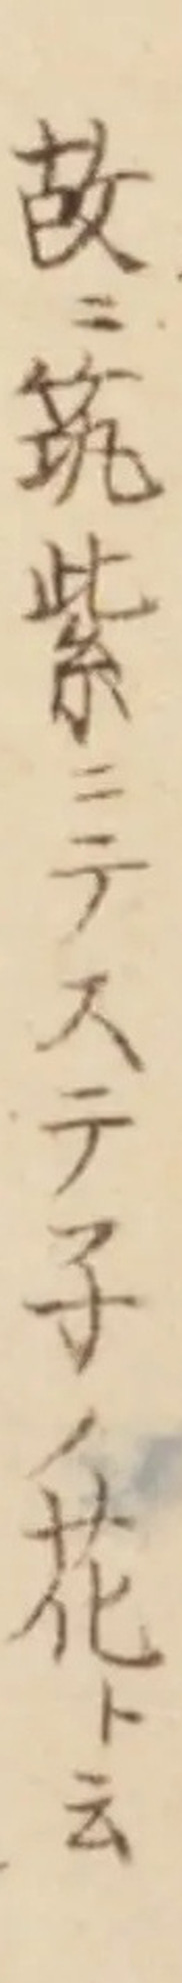故筑紫ニテステ子ノ花云
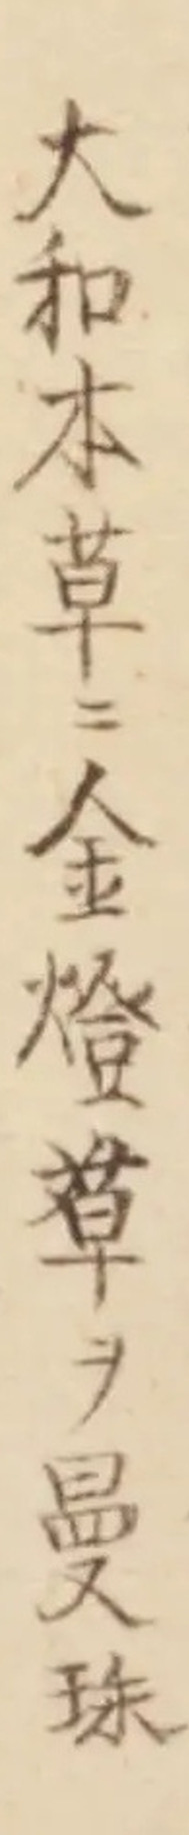大和本草ニ金灯草曼珠
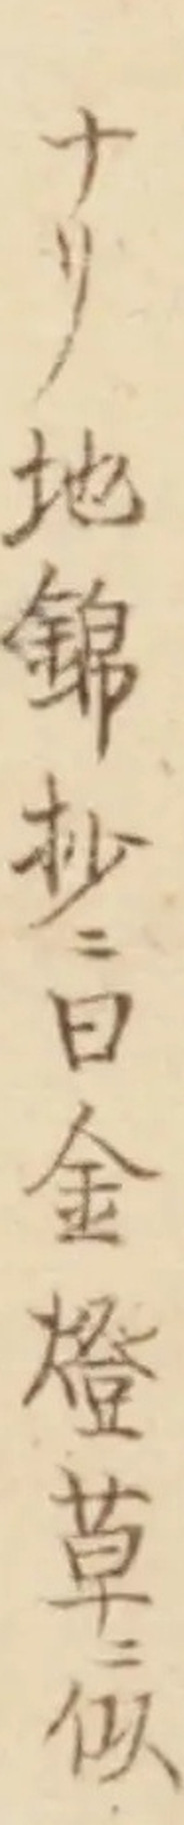ナリ地錦抄曰金灯草似
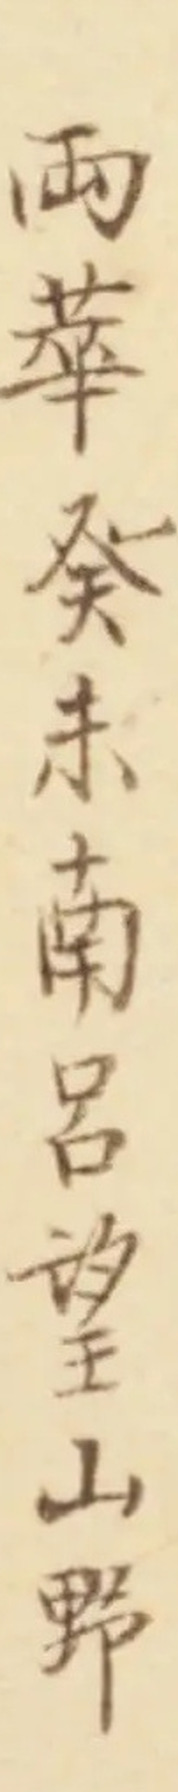両華癸未南呂望山野
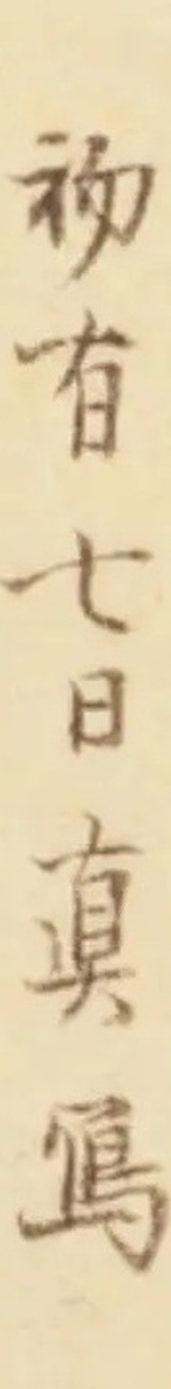有七日真写
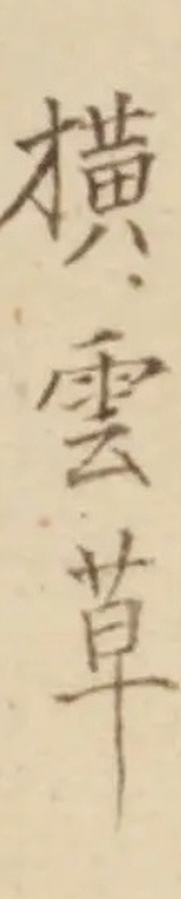横雲草
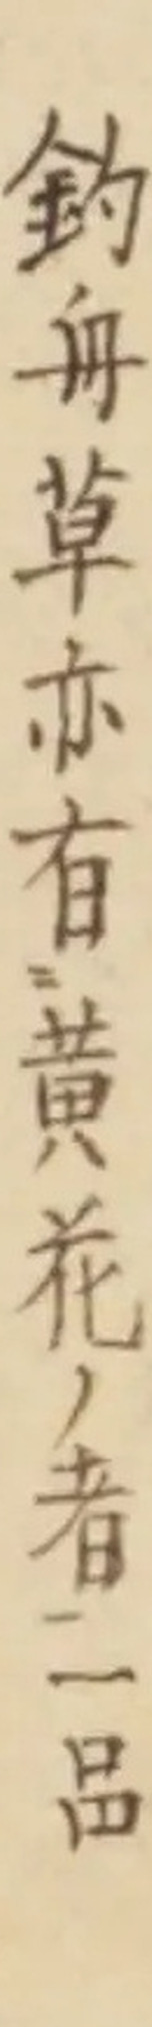釣舟草亦有黄花ノ者一品
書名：梅園草木花譜秋之部. 2
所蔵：国立国会図書館 National Diet Library, JAPAN
